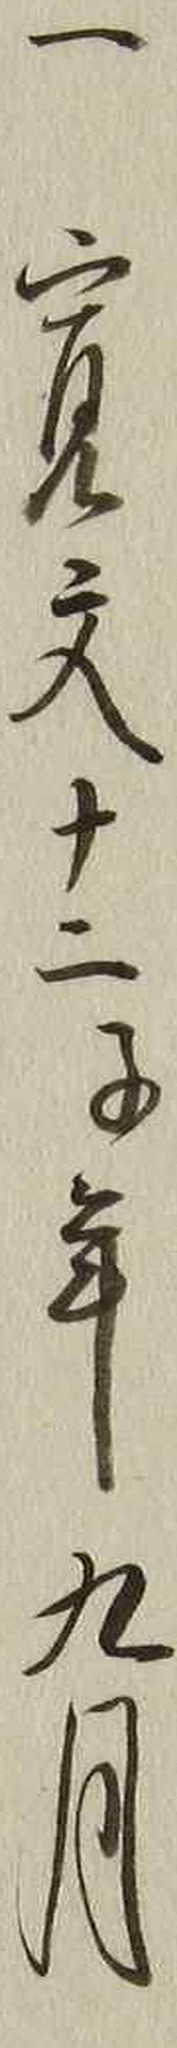一寛文十二子年九月
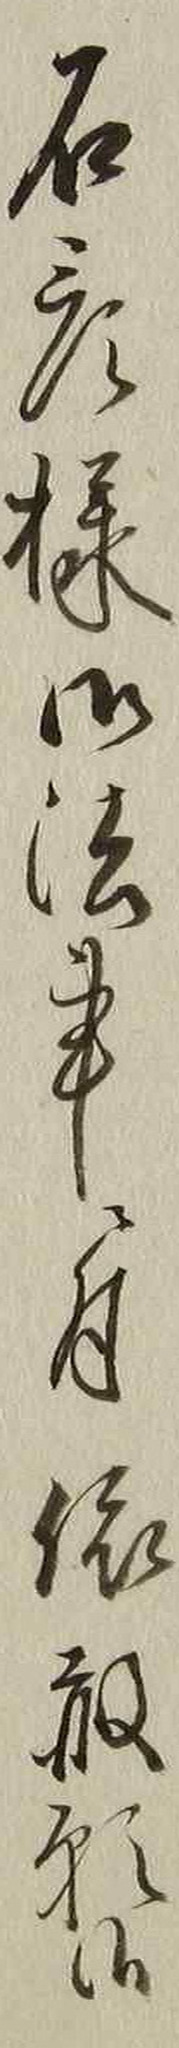石彦様御法事ニ付依赦願候
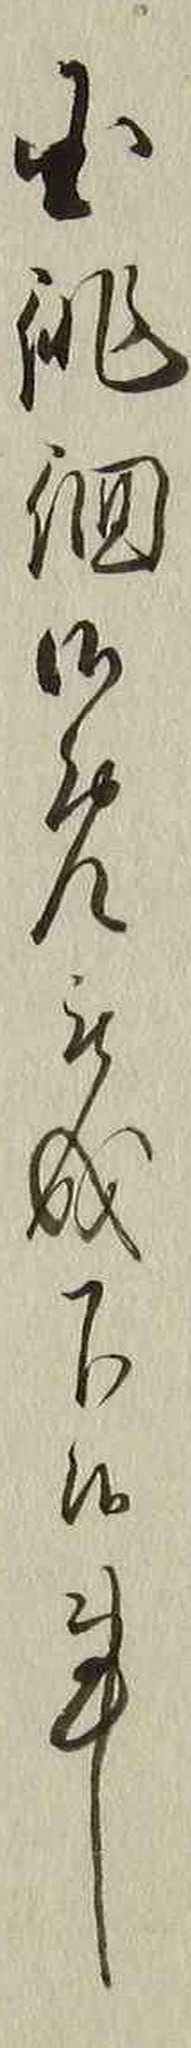国徘徊御免被成下候事
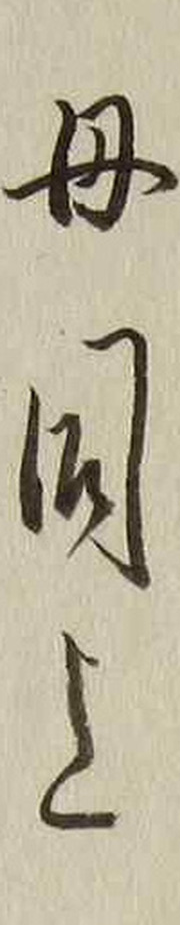母同上
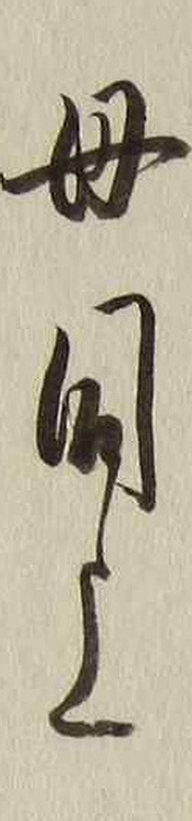母同上
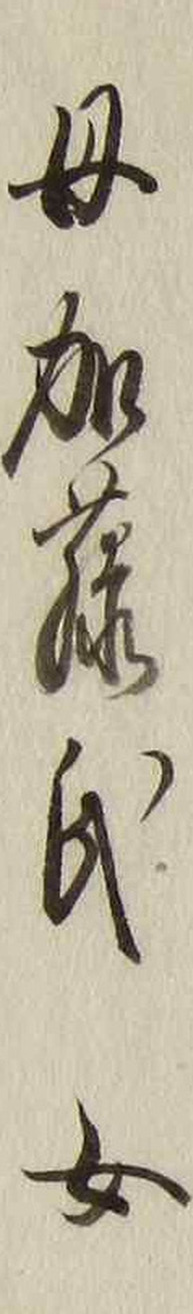母加藤氏女

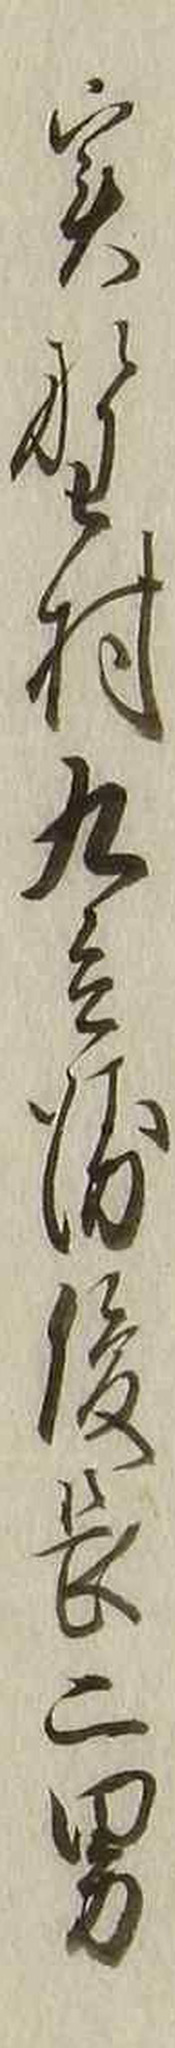実野村九兵衛俊長二男
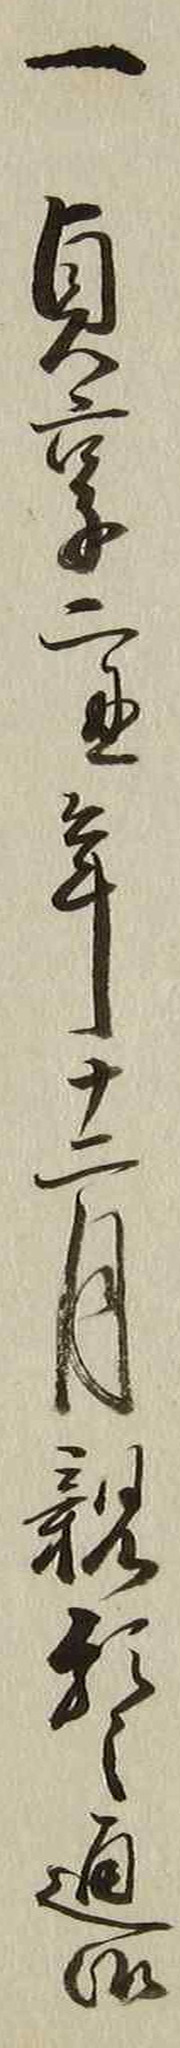一貞享二丑年十二月親願之通御
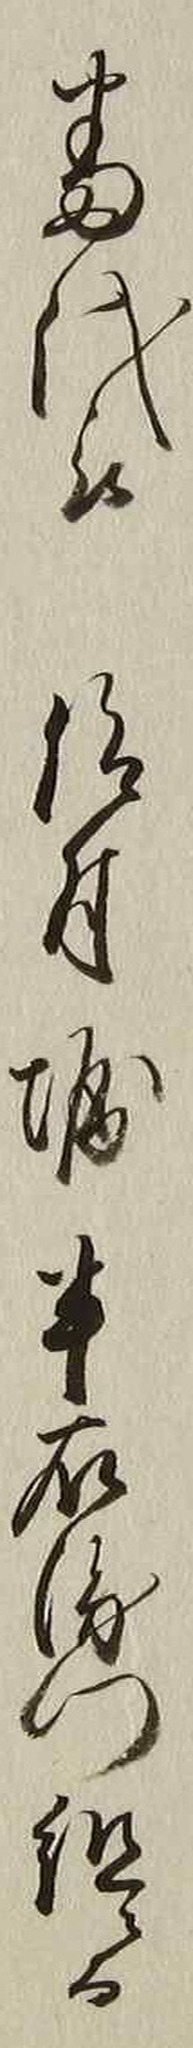番代被仰付堀半右衛門組ニ而
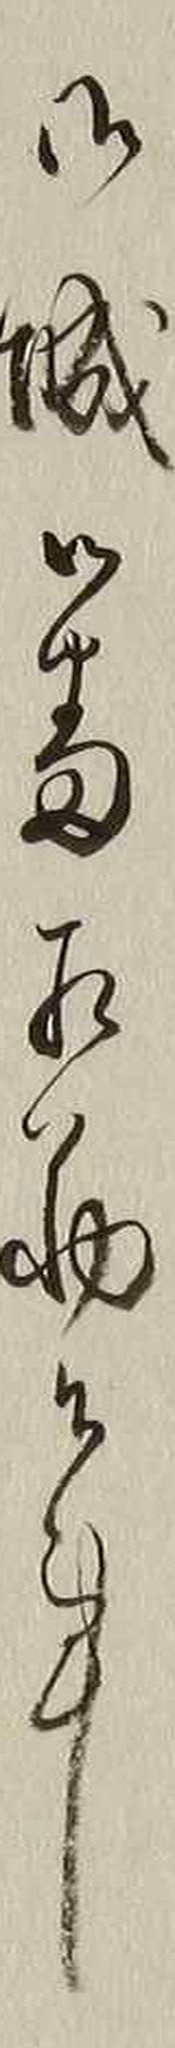御城御番相勤候事
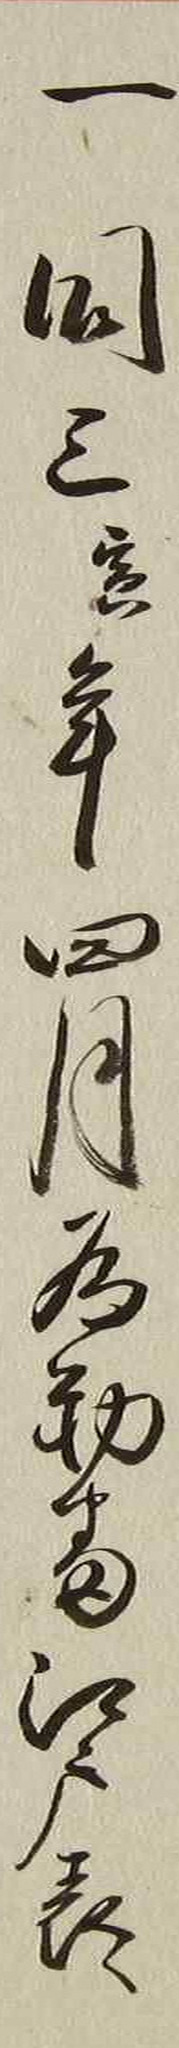一同三寅年四月為勤番江戸表へ
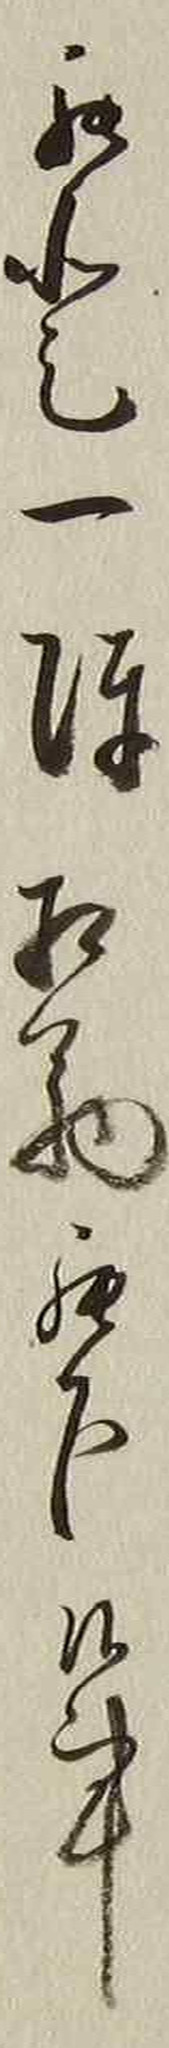罷登一陣相勤罷下候事
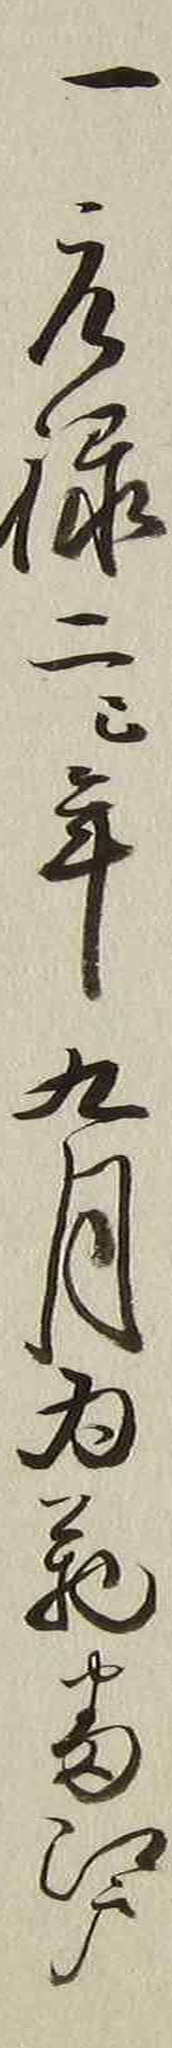一元禄二巳年九月為勤番江戸
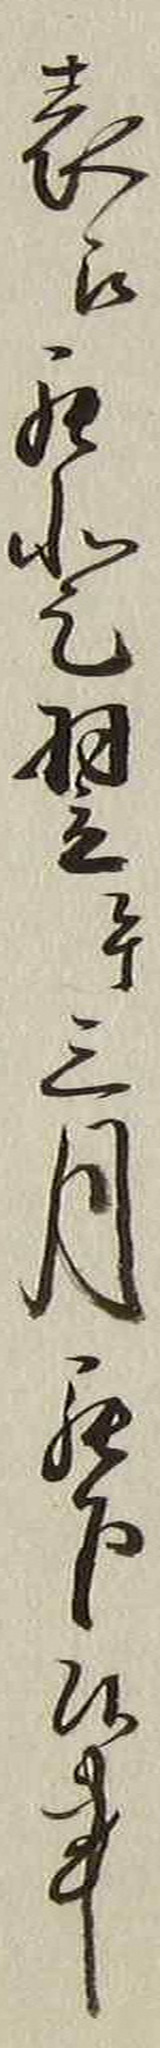表へ罷登翌午三月罷下候事
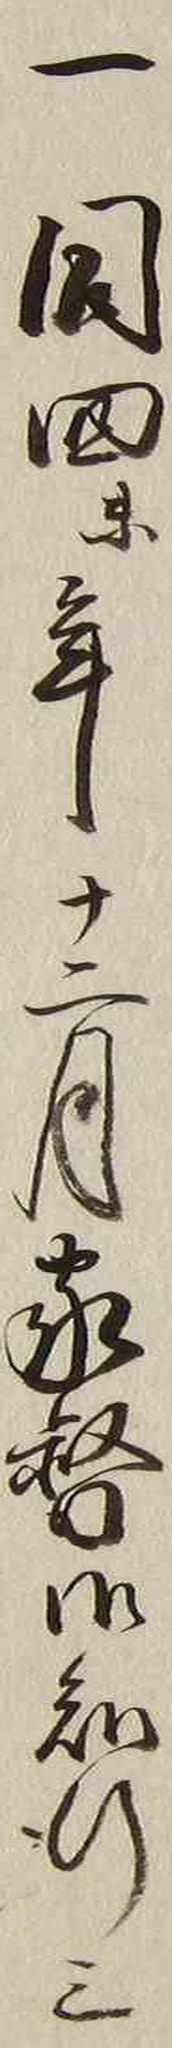一同四未年十二月家督御知行三
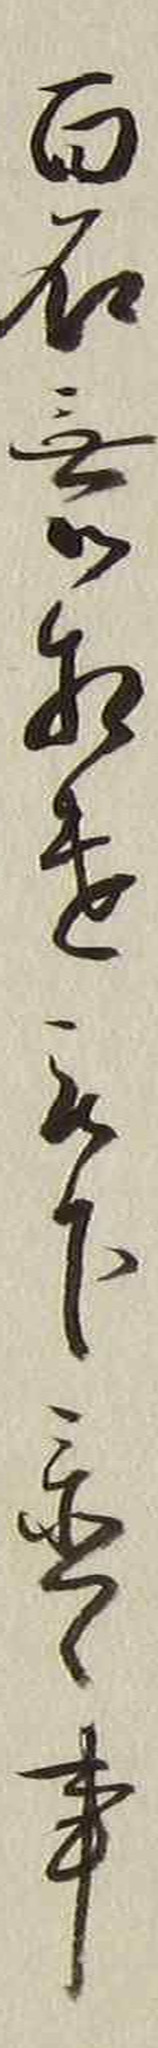百石無御相遣被下置候事
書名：諸士系譜　巻之18　い之部18
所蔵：会津若松市立会津図書館
